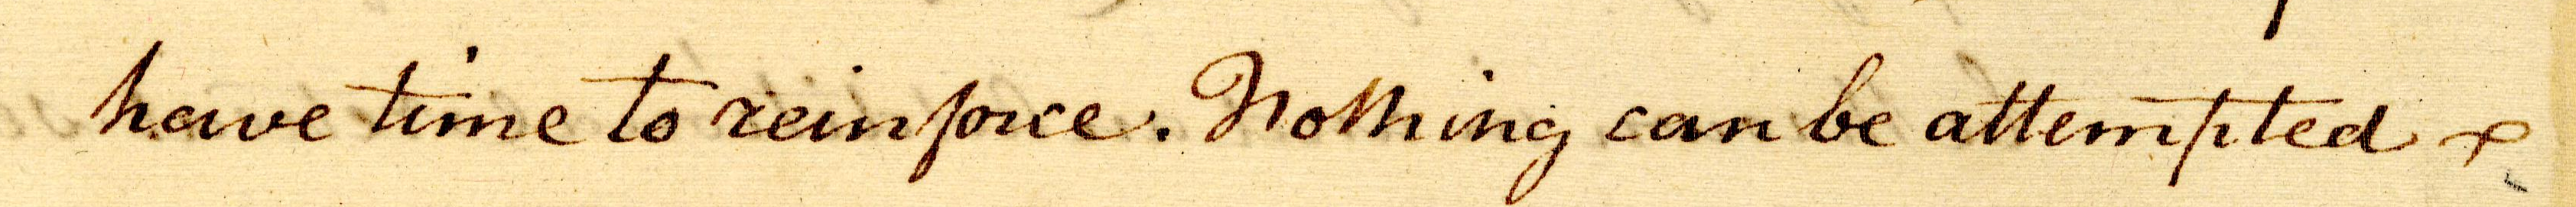have time to reinforce. Nothing can be attempted
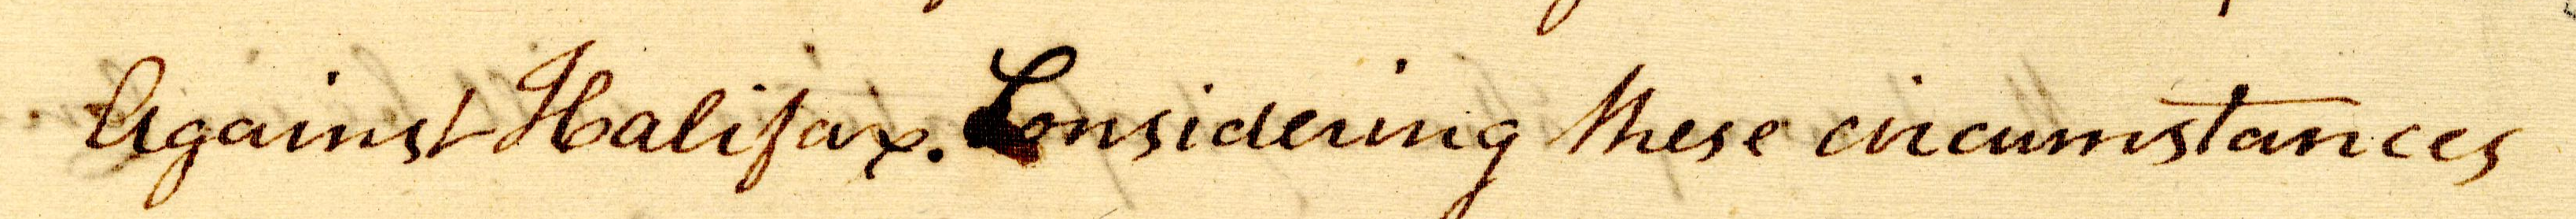Against Halifax. Considering these circumstances
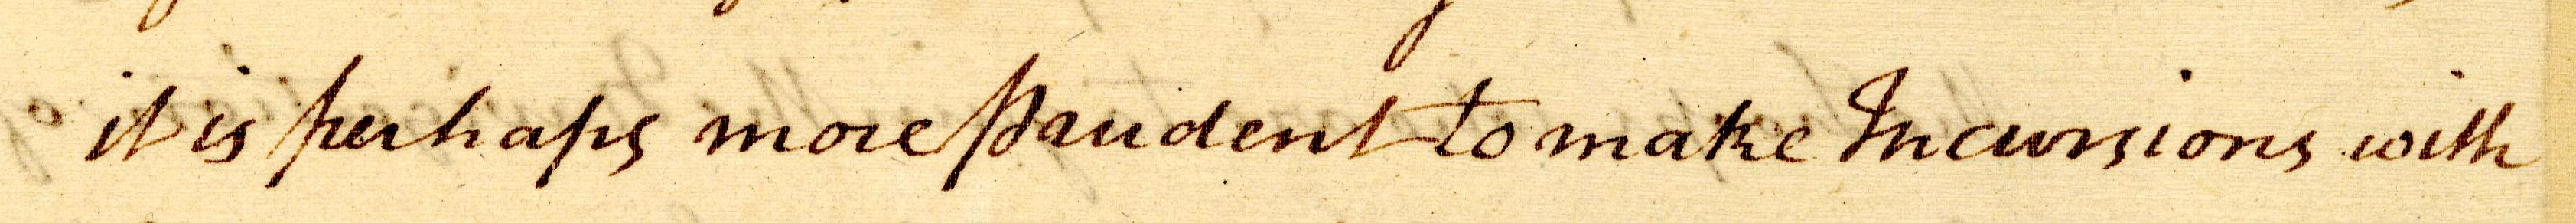it is perhaps more prudent to make Incursions with
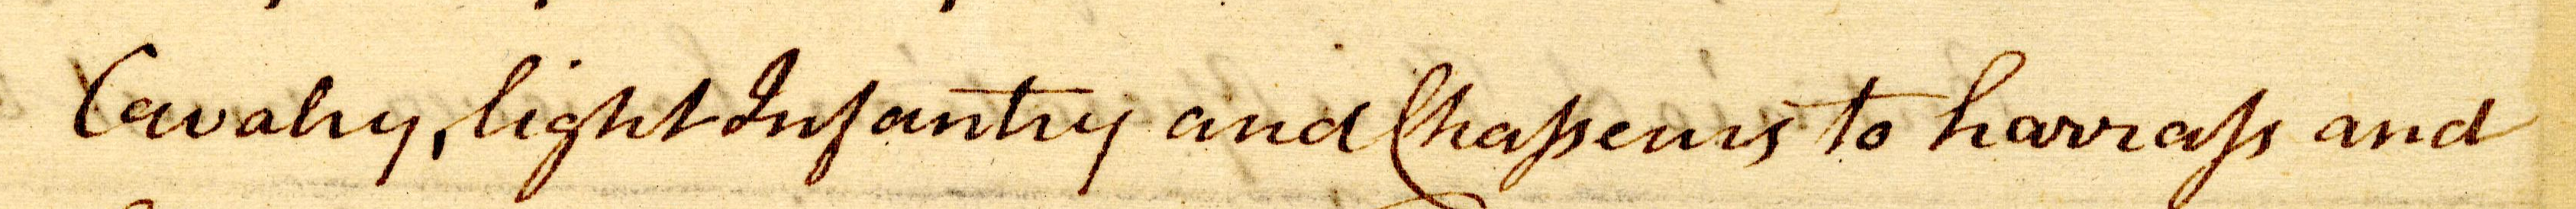Cavalry, light Infantry and Chasseurs to harrass and
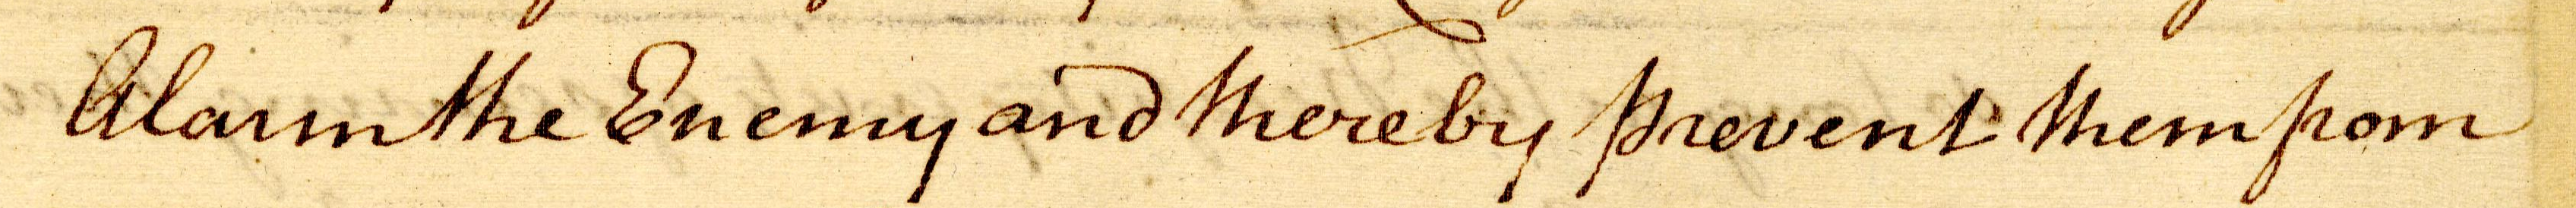Alarm the Enemy and thereby prevent them from
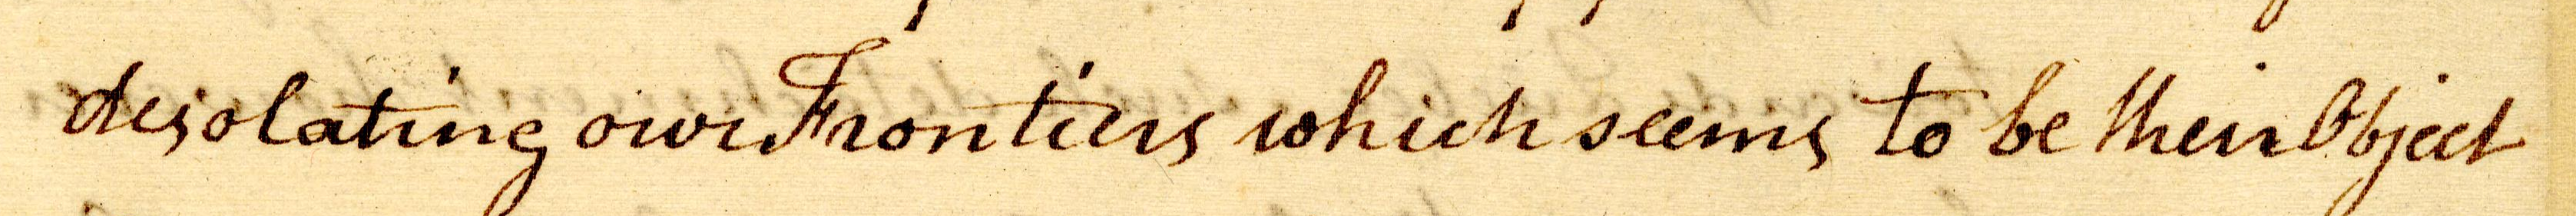desolating our Frontiers which seems to be their Object
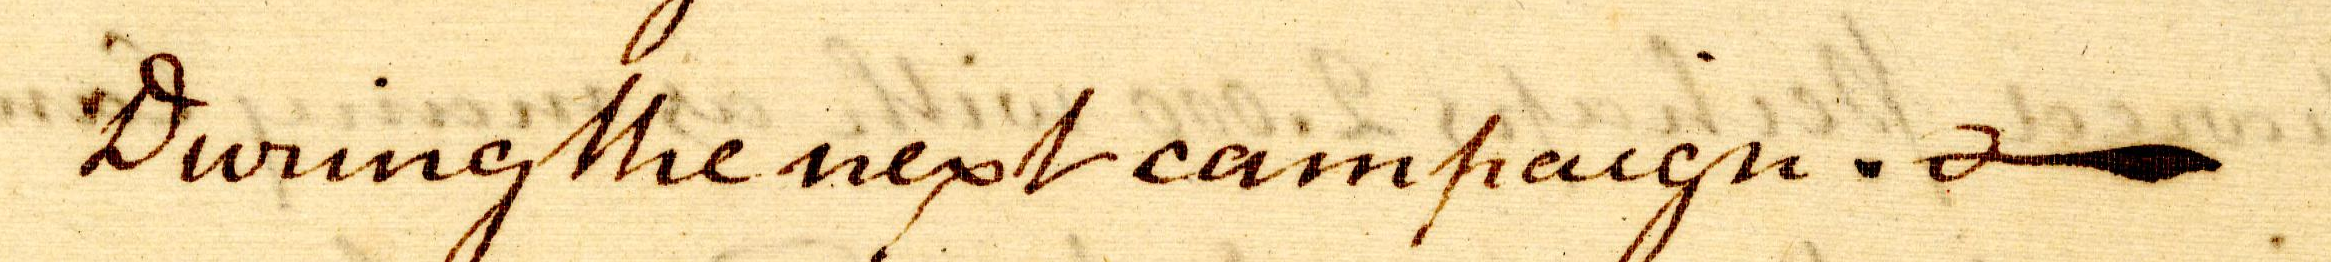During the next campaign.-
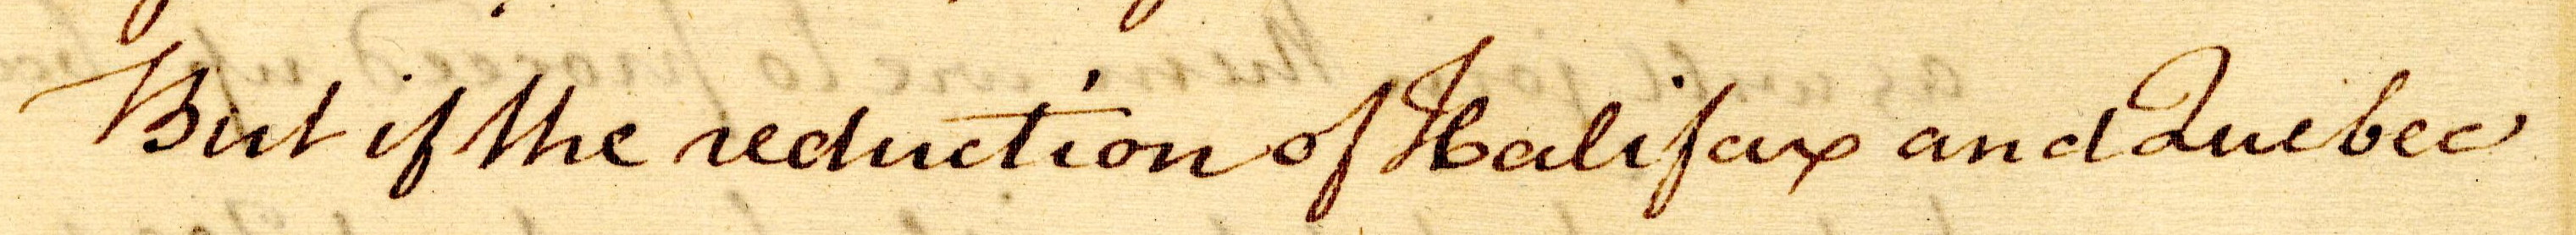But if the reduction of Halifax and Quebec
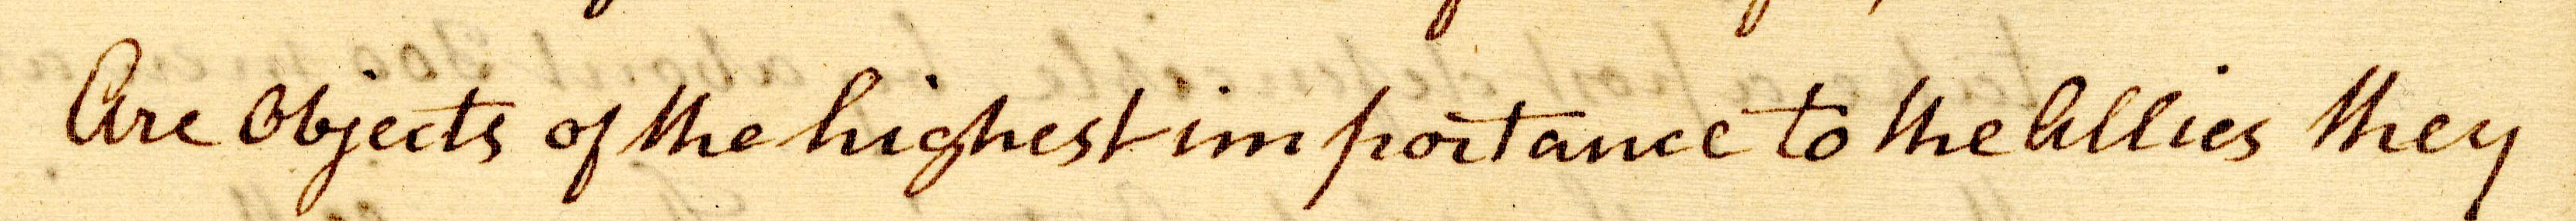Are objects of the highest importance to the Allies they
